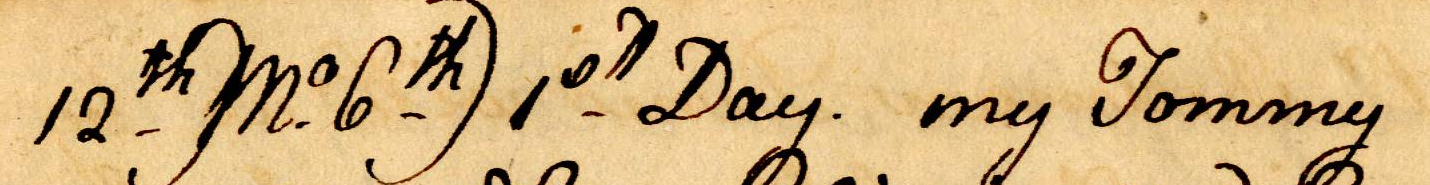12^th)M^o 6^th) 1^st Day. my Tommy
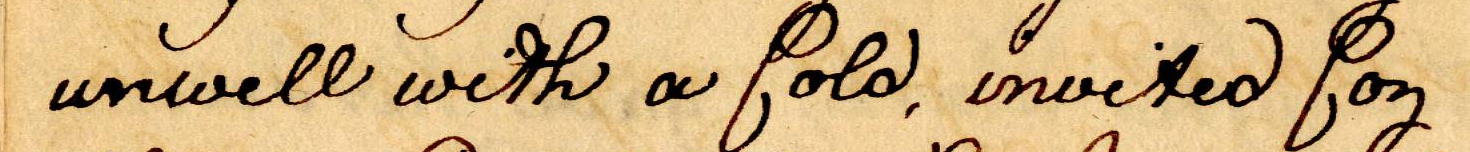unwell with a Cold, invited Coz
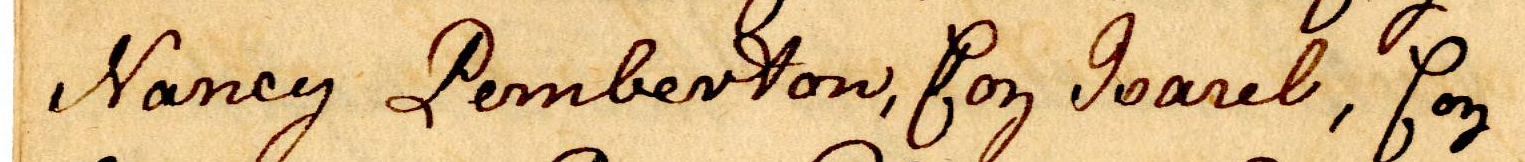Nancy Pemberton, Coz Isarel, Coz
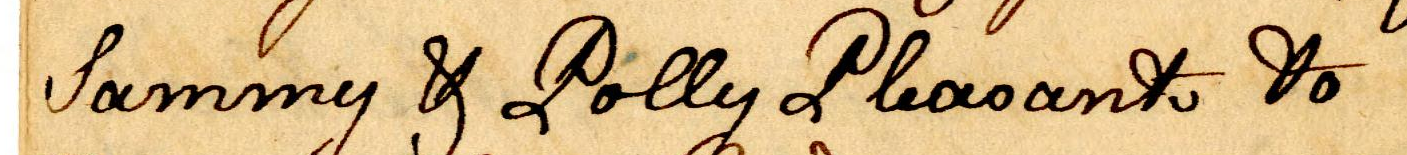Sammy & Polly Pleasants to
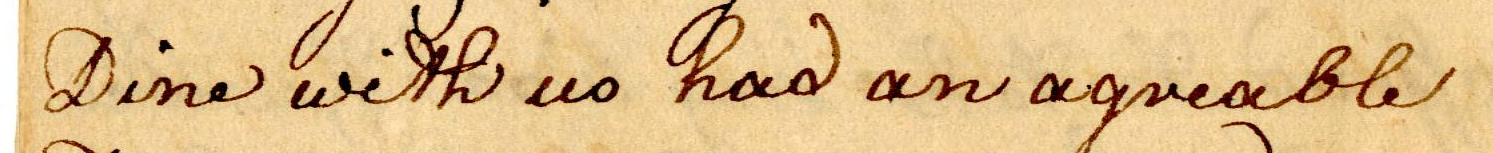Dine with us had an agreable
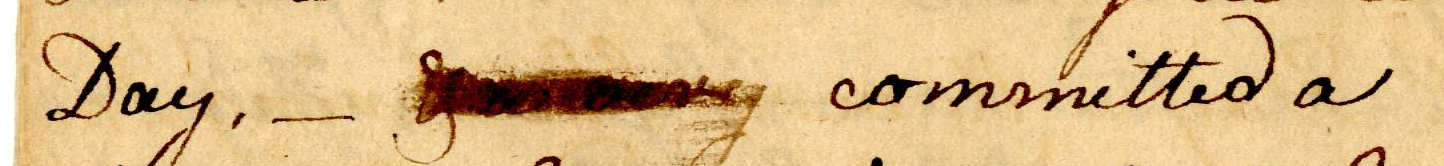Day. [___] committed a
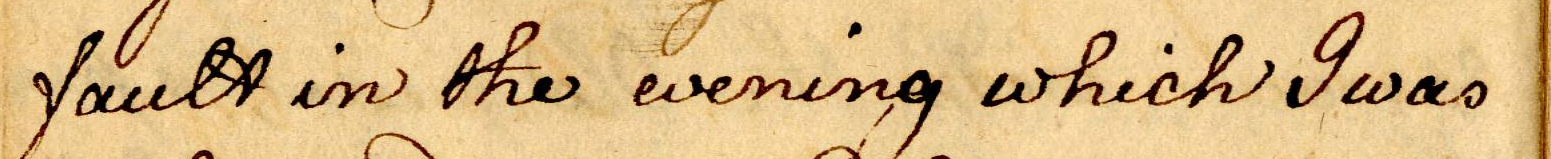fault in the evening which I was
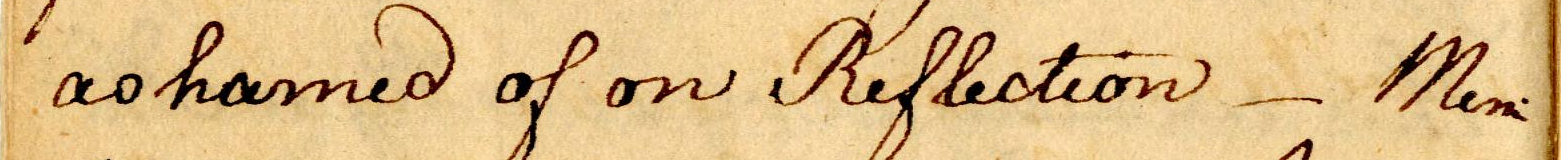ashamed of on Reflection- Men
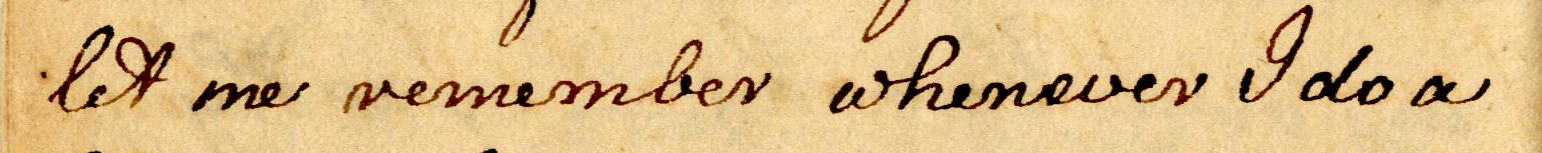let me remember whenever I do a
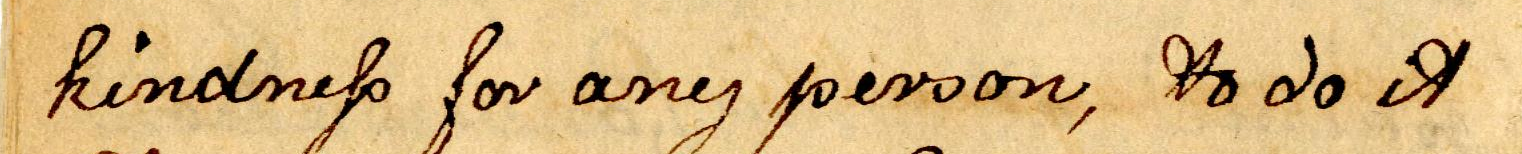kindness for any person, to do it
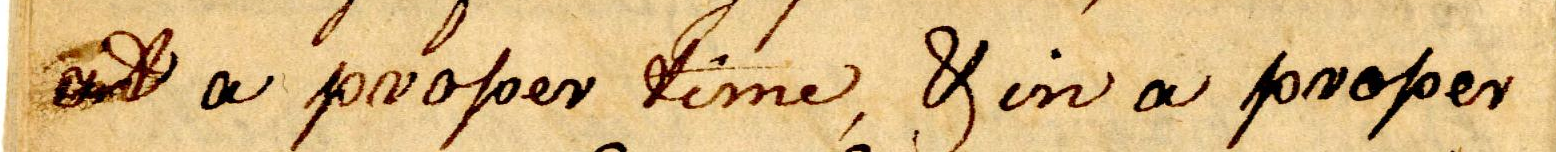at a proper time, & in a proper
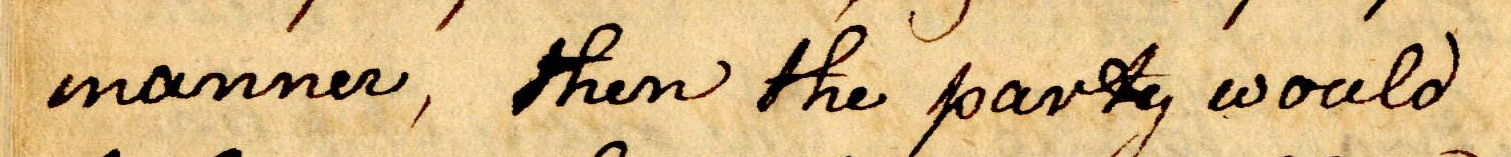manner, then the party would
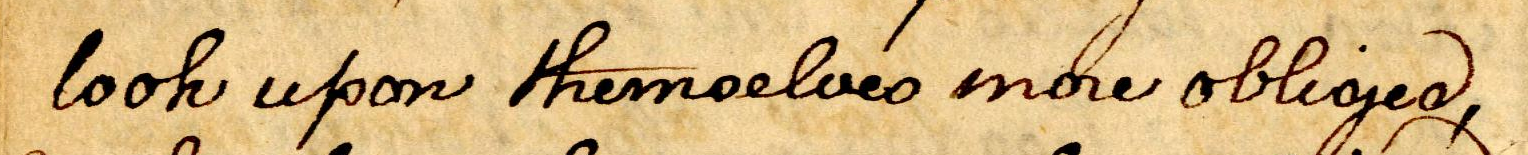look upon themselves more obliged,
